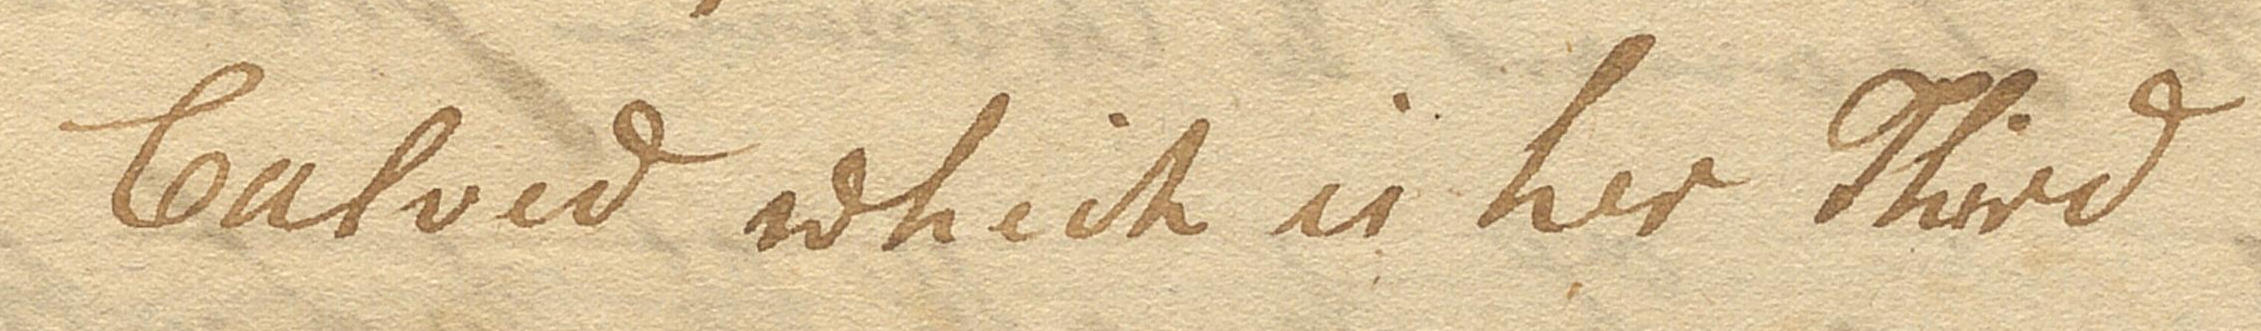Calved which is her Third
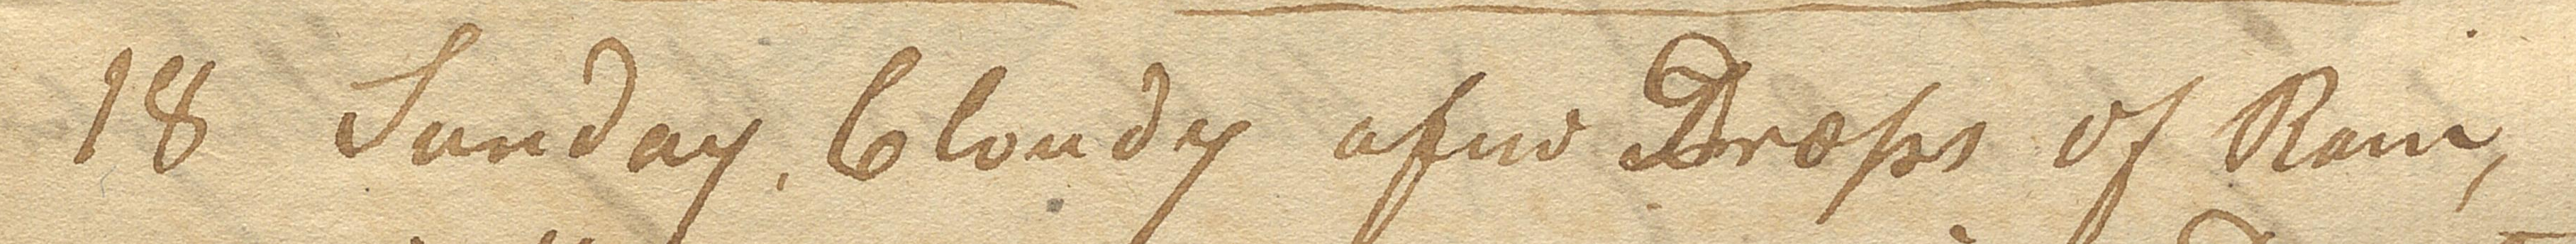18 Sunday. Cloudy a few Drops of Rain,
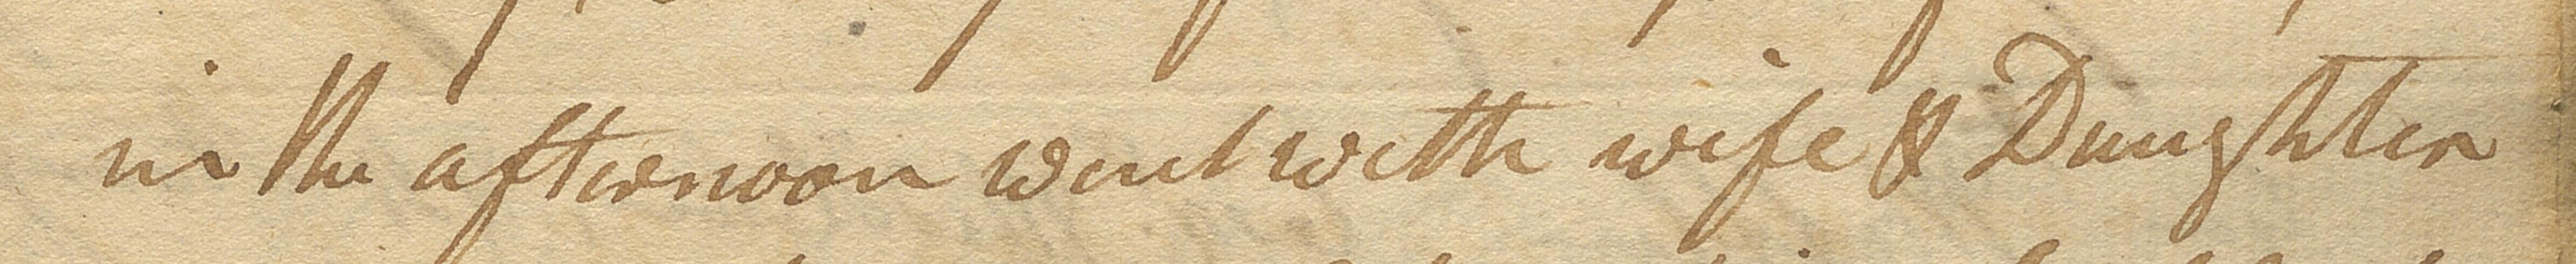in the afternoon went with wife & Daughter
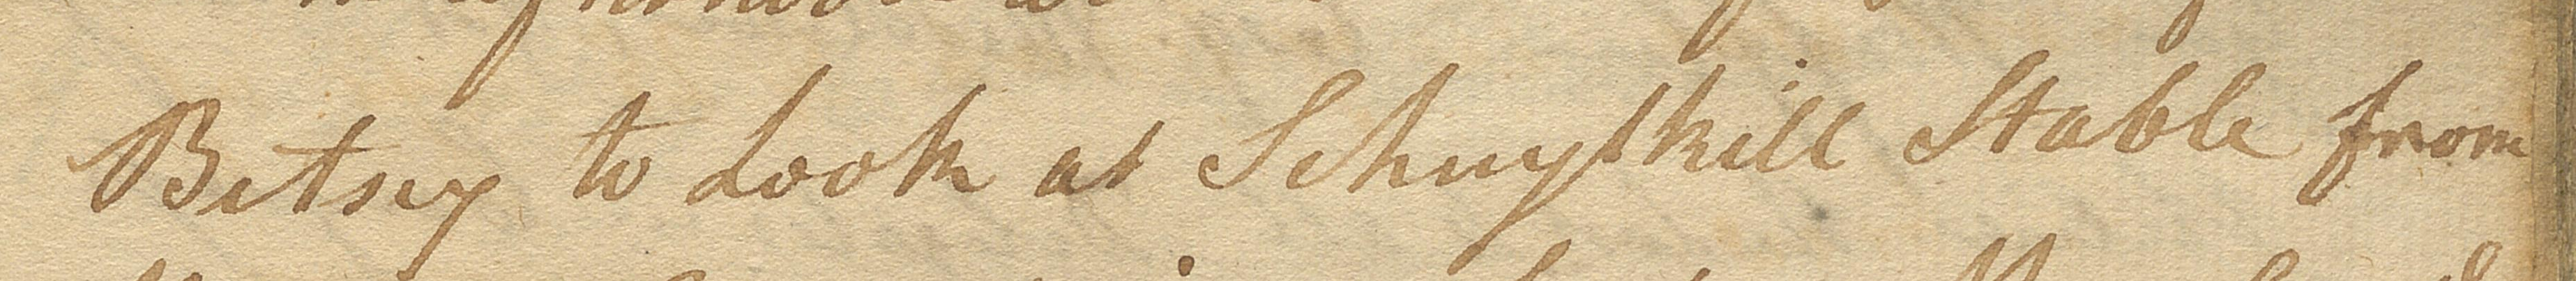Betsey to Look at Schuylkill Stable from
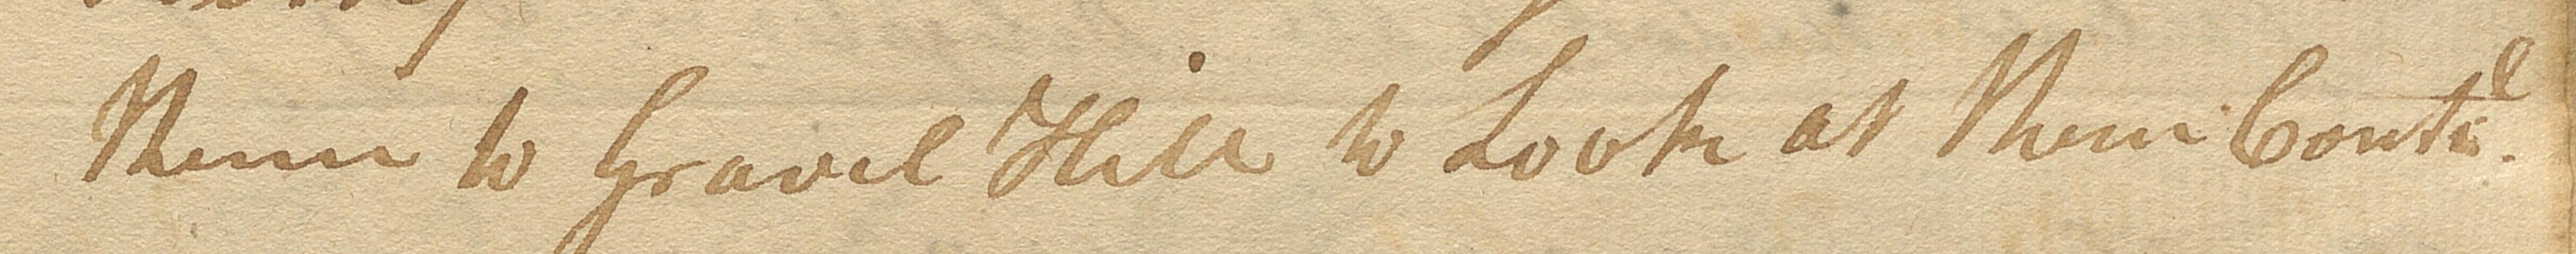thence to Gravel Hill to Look at them Conti^l.
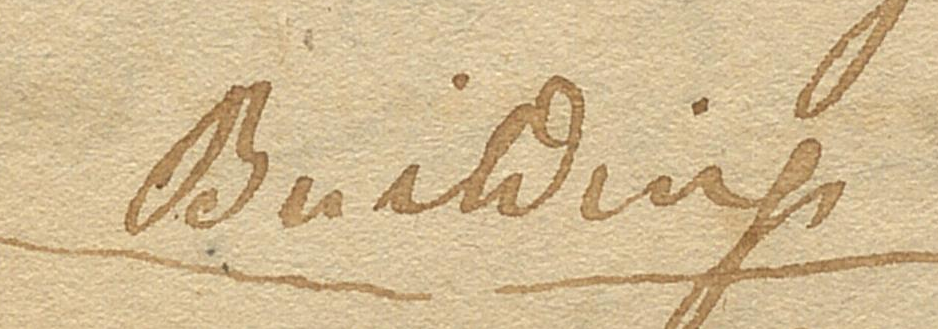Buildings
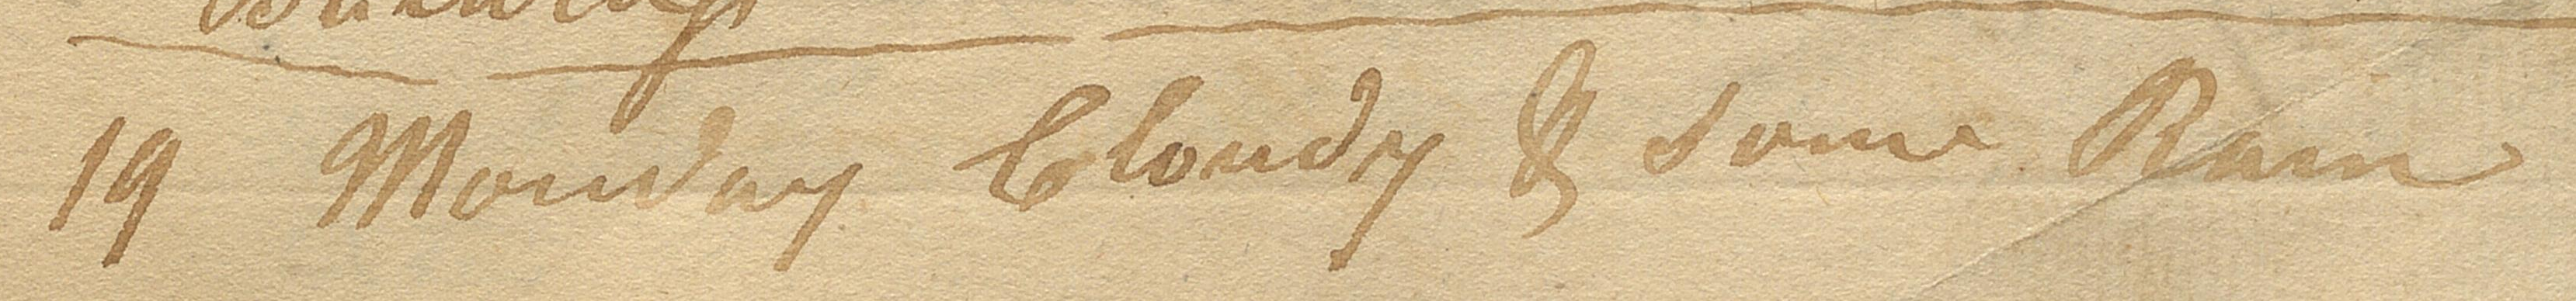19 Monday Cloudy & some Rain
